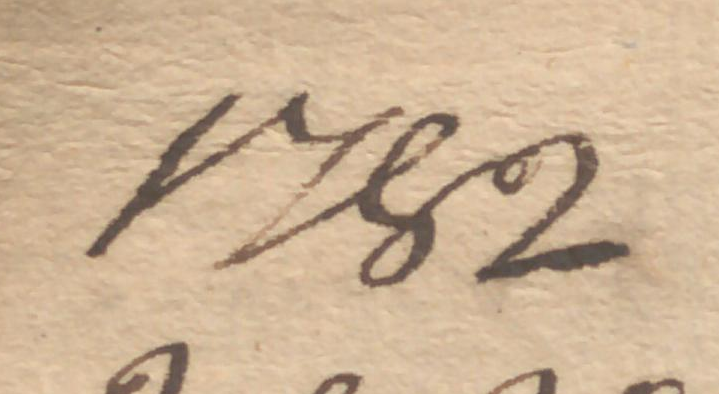1782
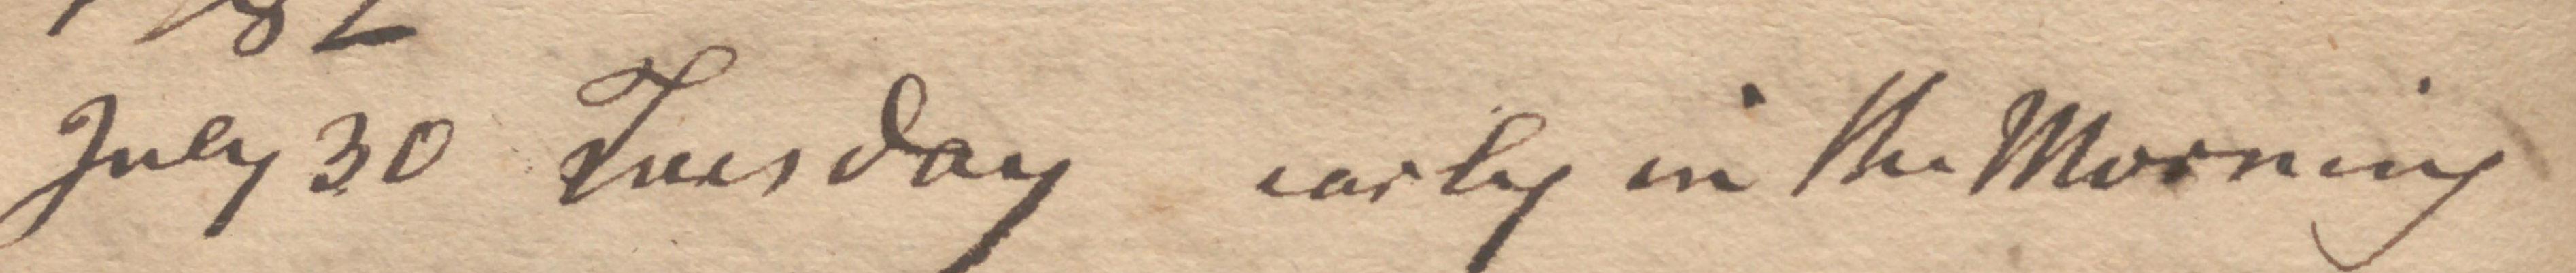July 30 Tuesday early in the Morning
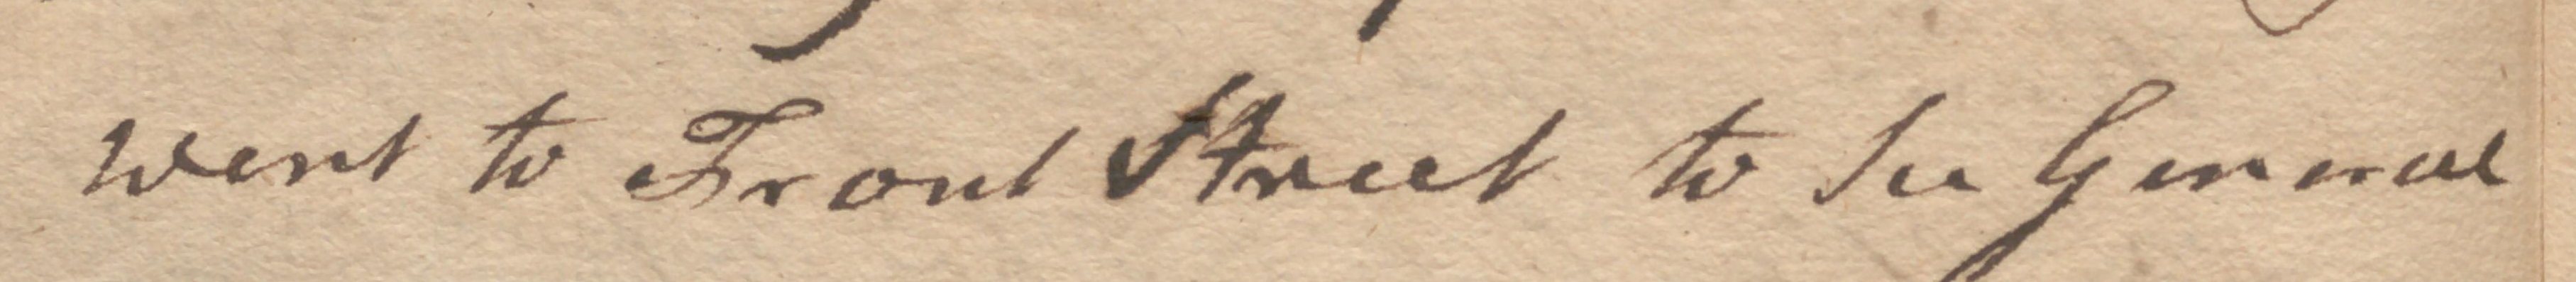went to Front Street to see General
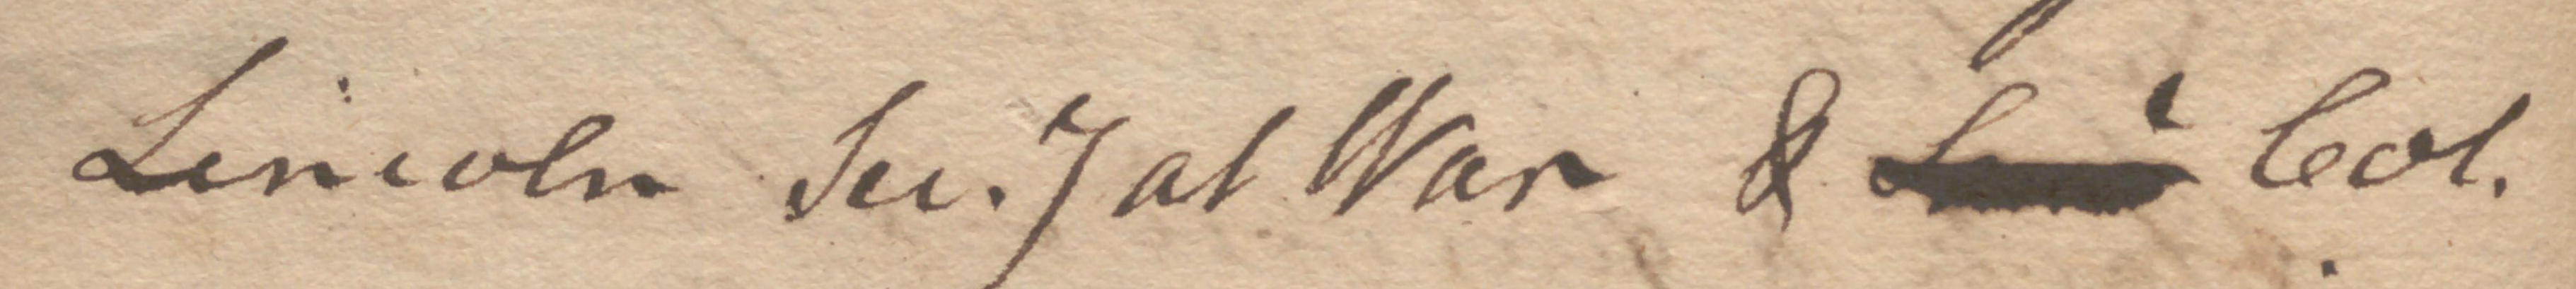Linioln Sec^y. at War & [_____] Col.
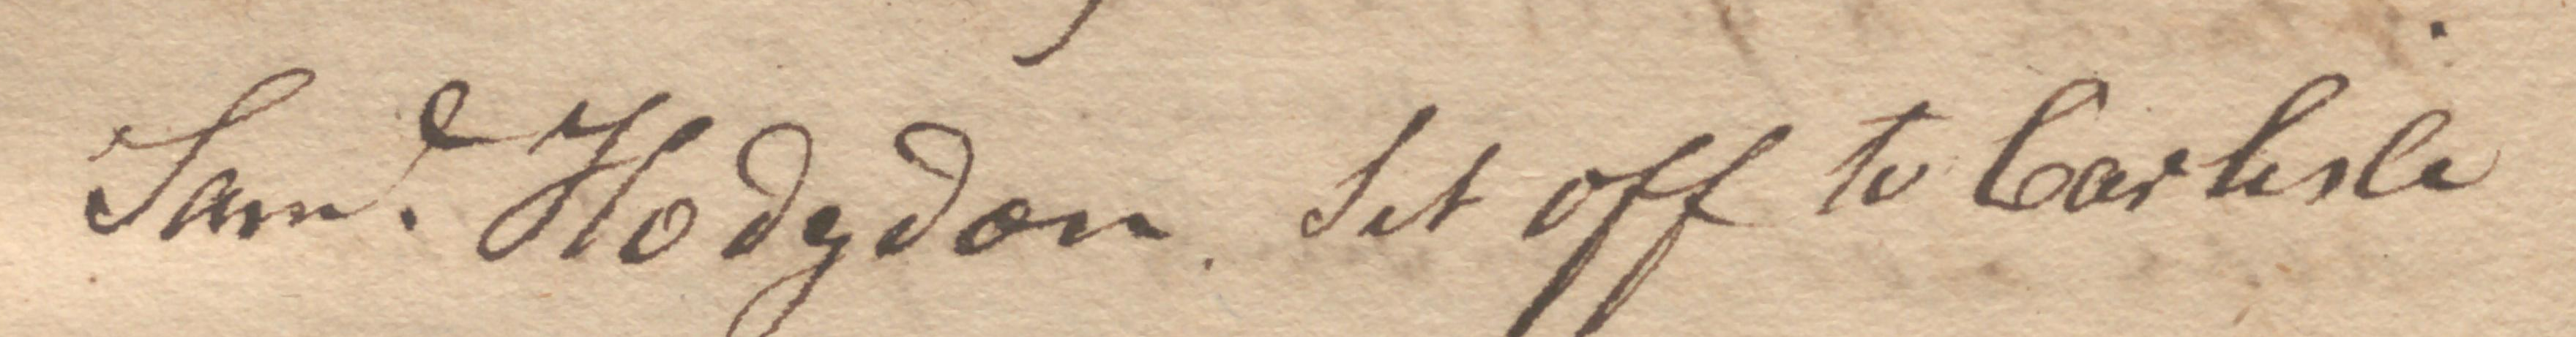Sam^l. Hodgdon Set off to Carlisle
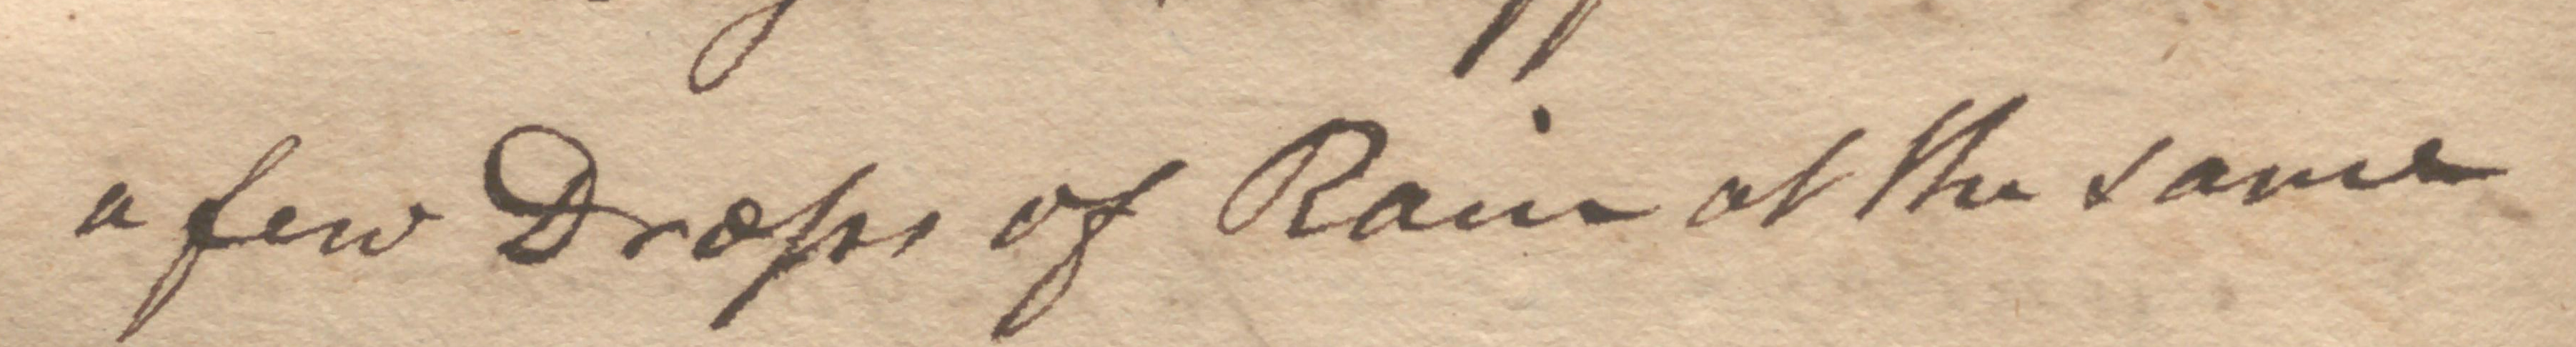a few Drops of Rain at the same
